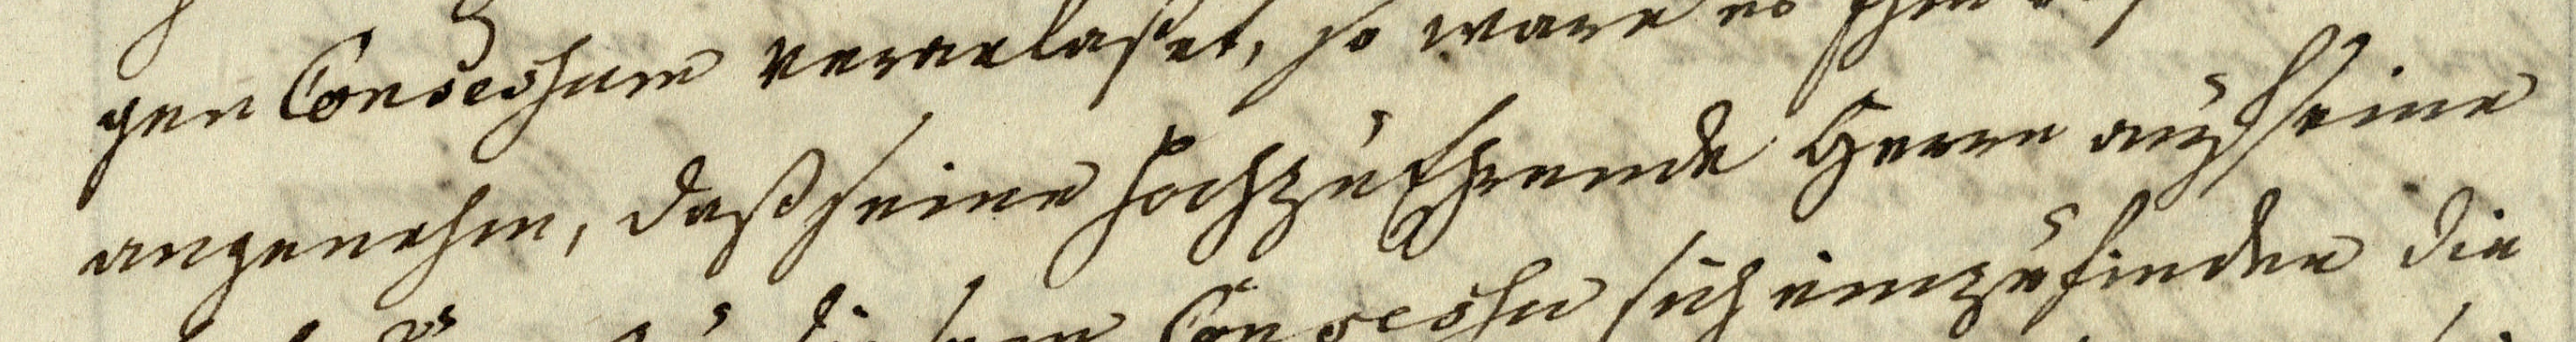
angenehm, daß seine hochzuEhrende Herrn auf seine
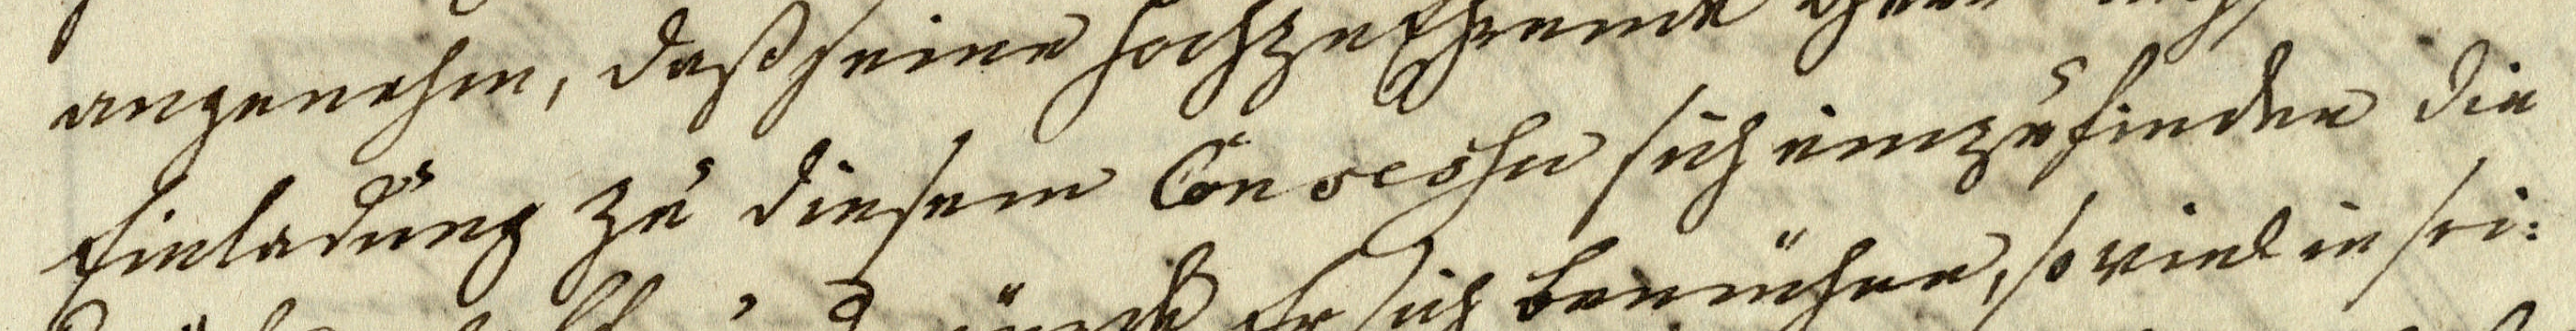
Einladung zu diesem Cosessu sich einzufinden die
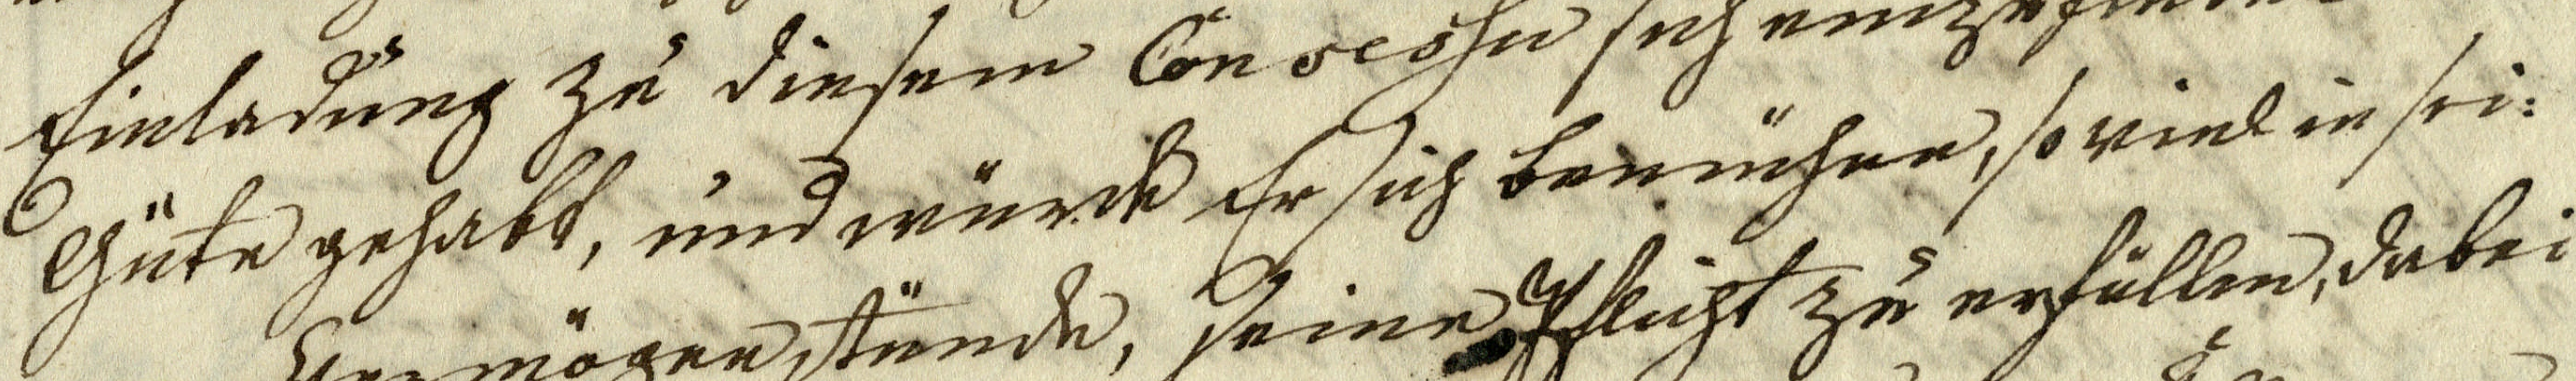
Güte gehabt, und würde Er sich bemühen, soviel in sei¬
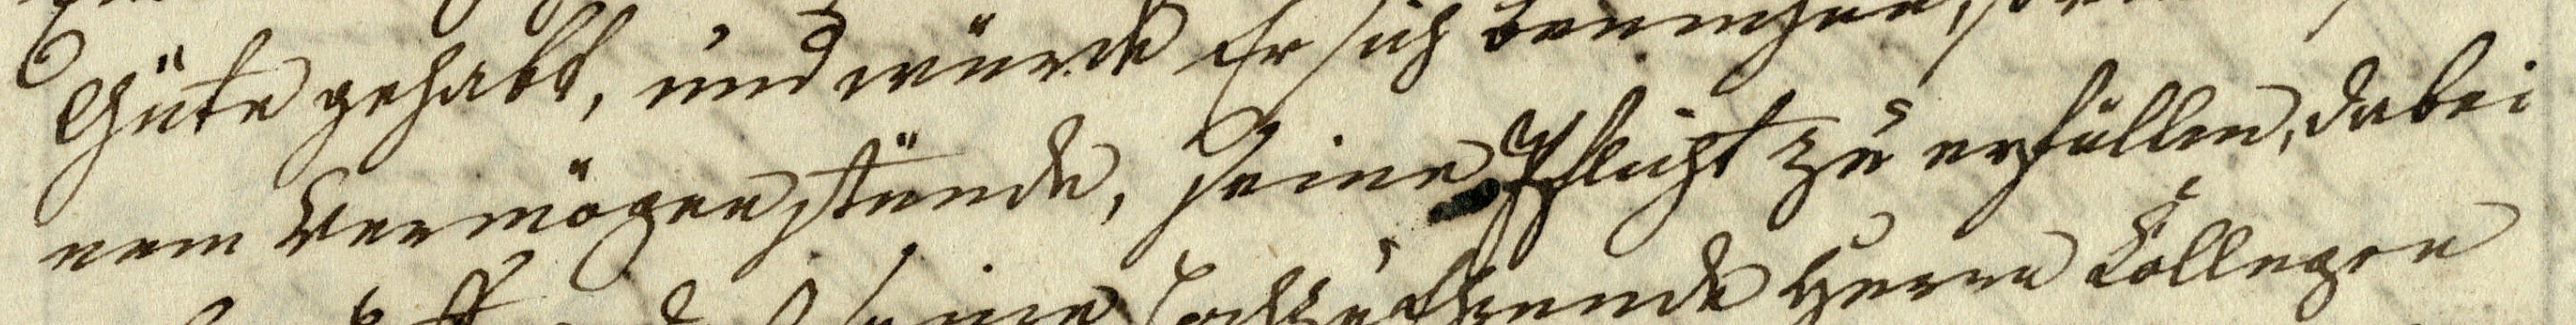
nem Vermögen stünde, seine Pflicht zu erfüllen, dabei
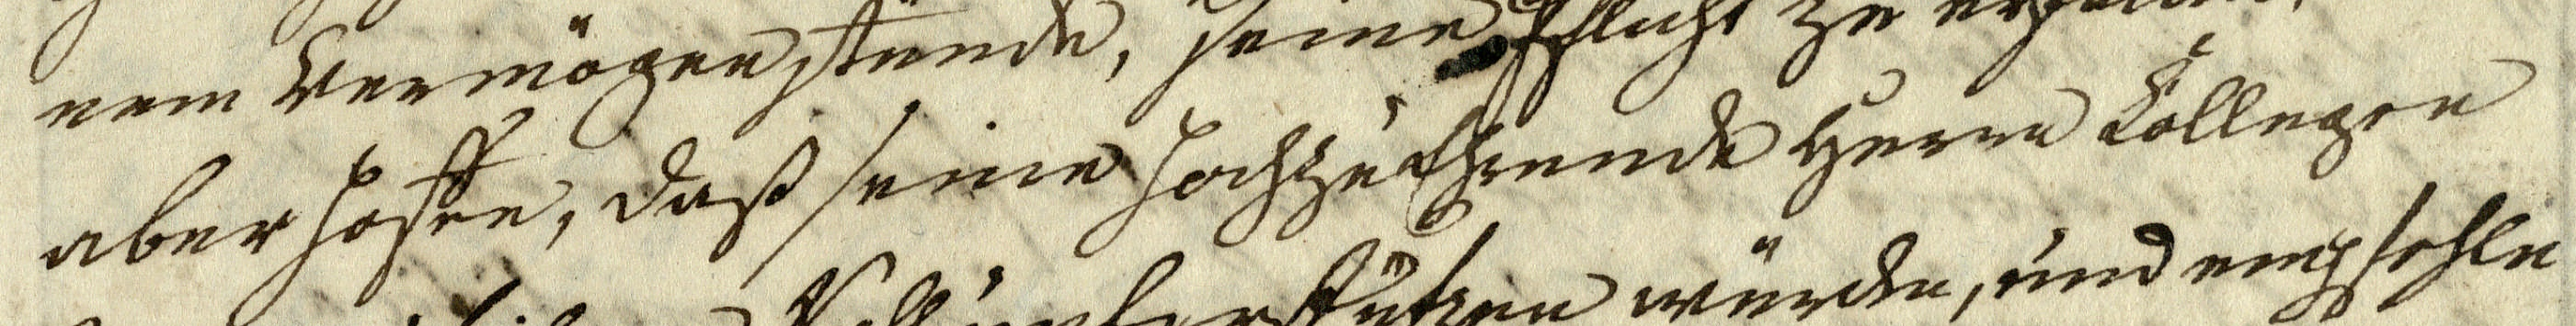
aber hoffen, daß seine hochzuEhrende Herrn Collegen
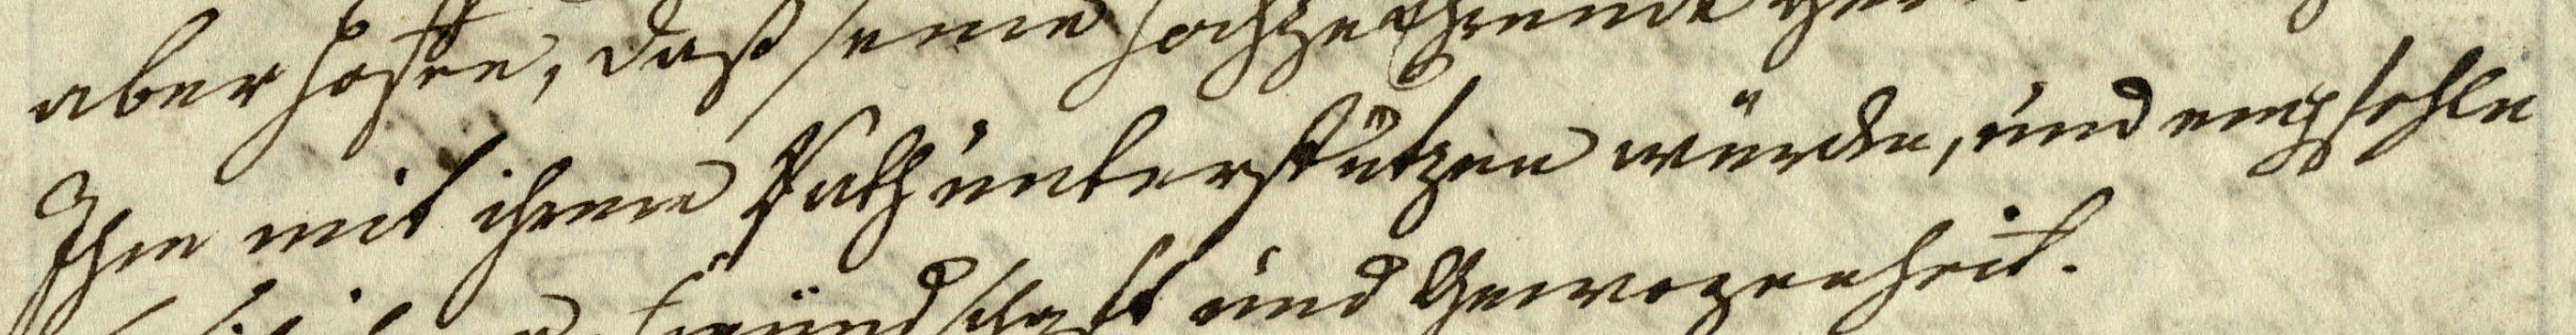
Ihm mit ihrem Rath unterstützen würden, und empfehle
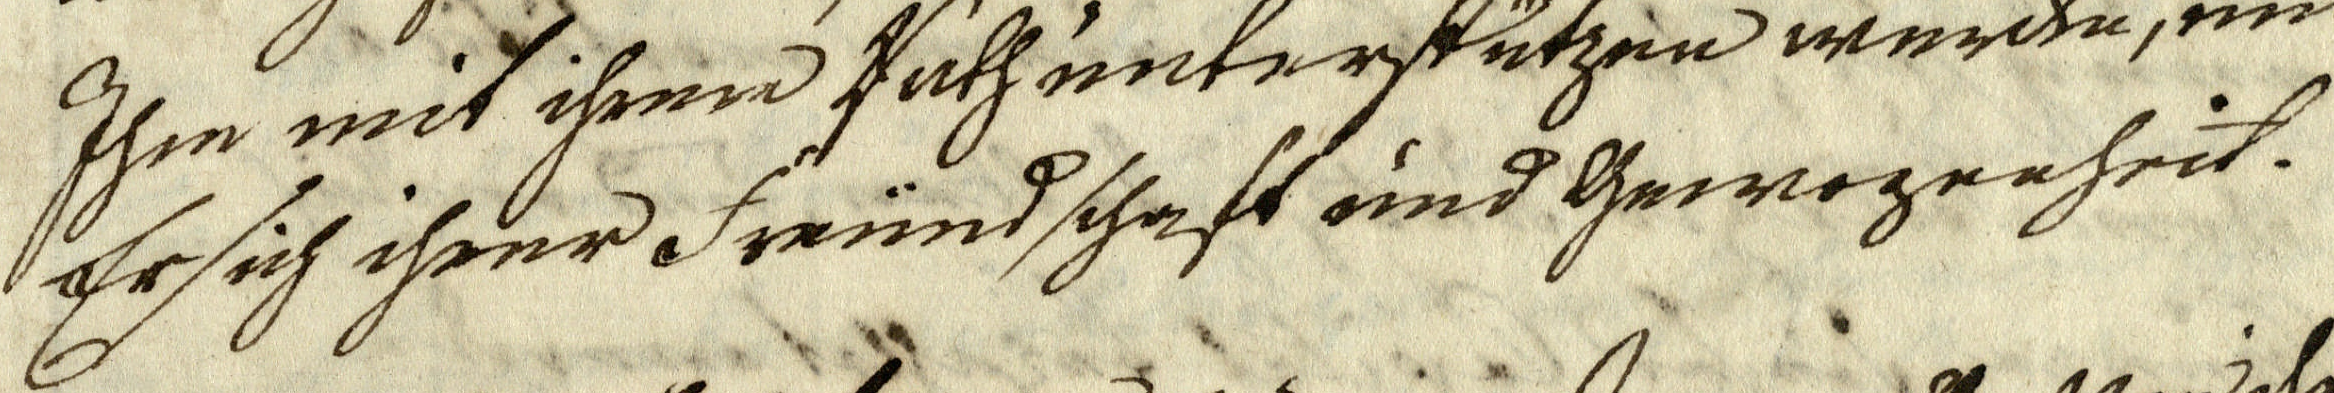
Er sich ihrer Freundschaft und Gewogenheit.
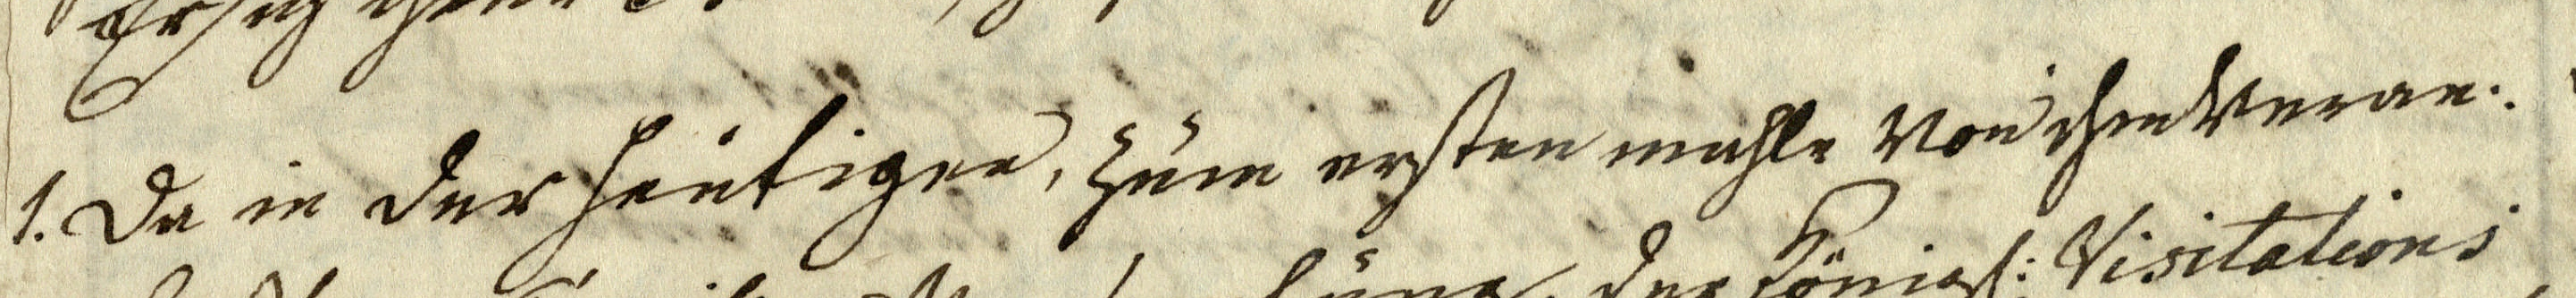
1. Da in der heutigen, zum ersten mahle von ihm veran¬
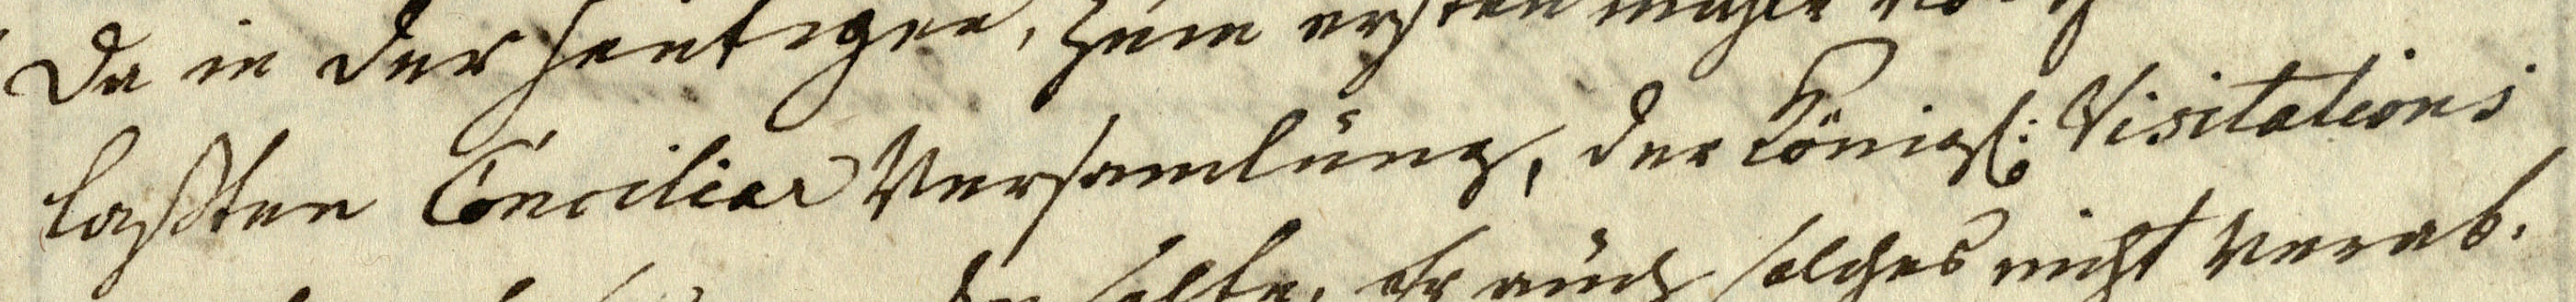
laßten Conciliar Versamlung, der Königl. Visitations Receß
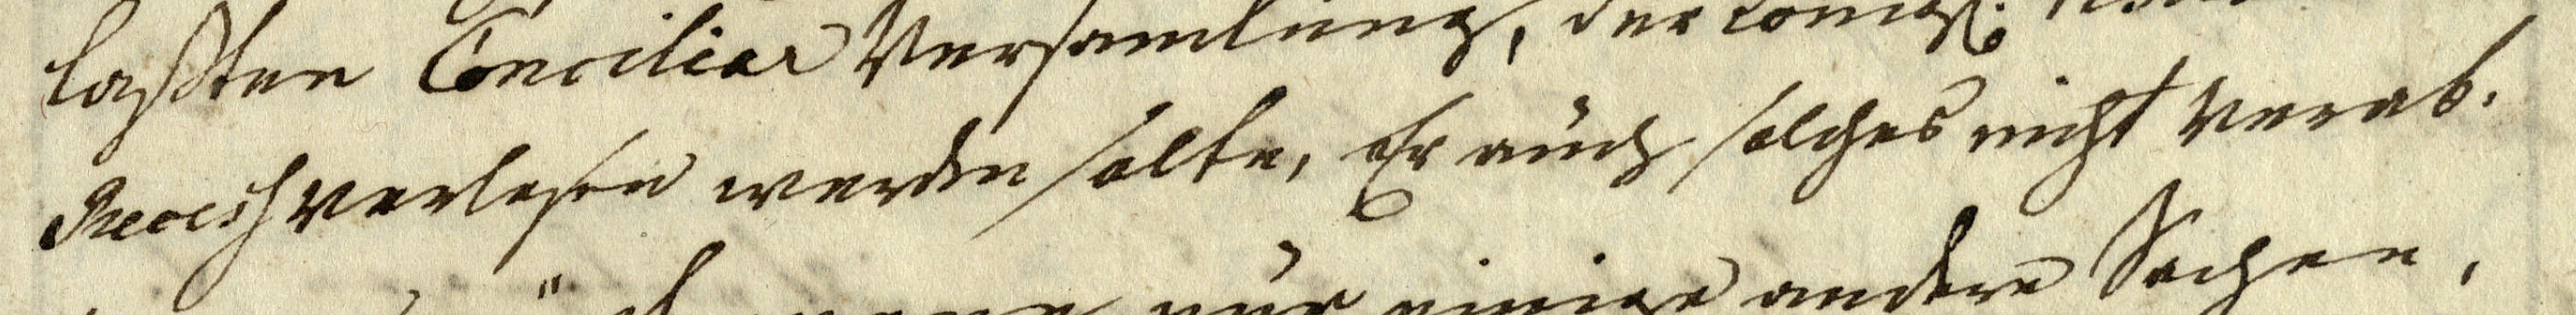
Recess verlesen werden solte, Er auch solches nicht verab¬
